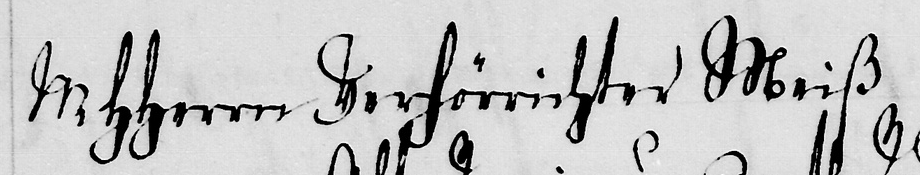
MHHerren Verhörrichter Meiß
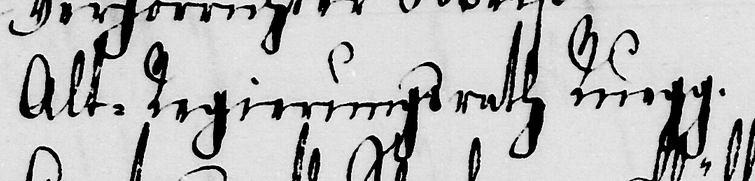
Alt-Regierungsrath Ruegg.
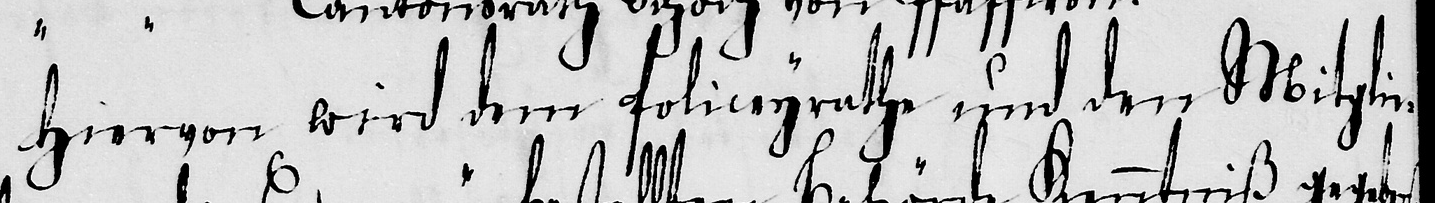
Hiervon wird dem Policeyrathe und den Mitgli¬
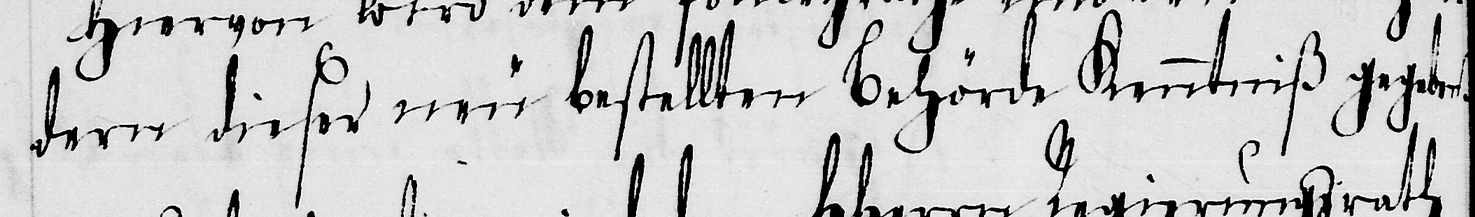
edern dieser neu bestellten Behörde Kenntniß gegeb¬
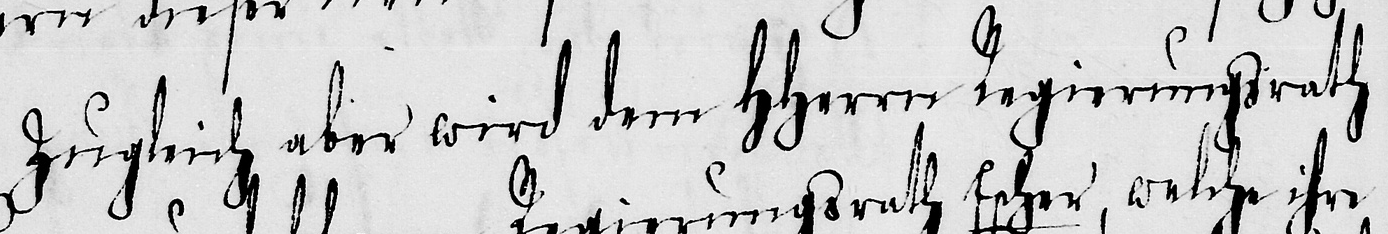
Zugleich aber wird dem HHerrn Regierungsrath
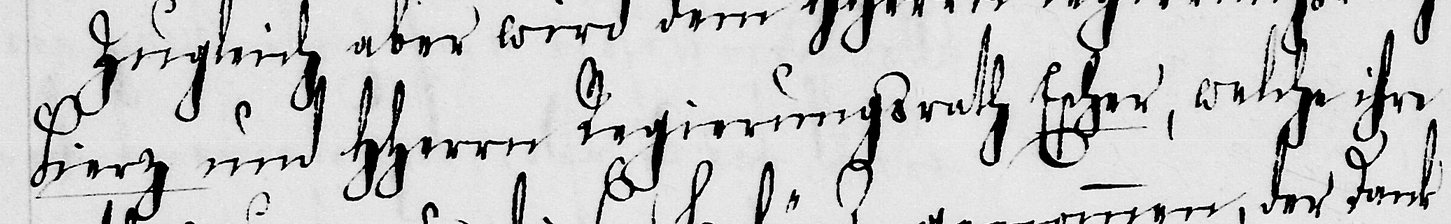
Fierz und HHerrn Regierungsrath Escher, welche ih¬
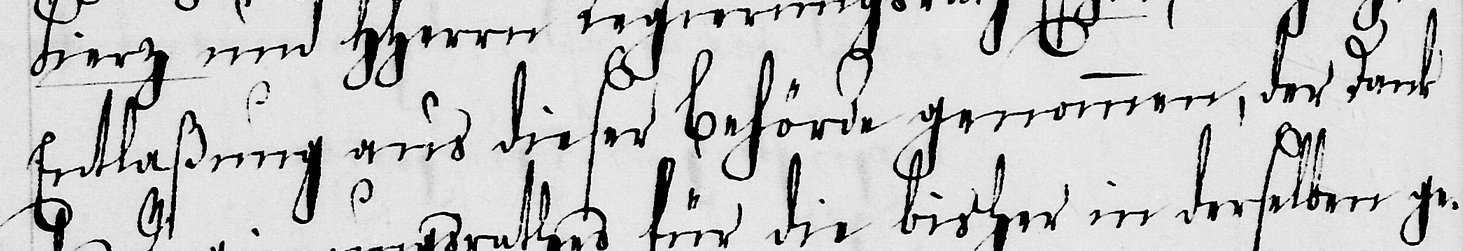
Entlaßung aus dieser Behörde genommen, der Dank
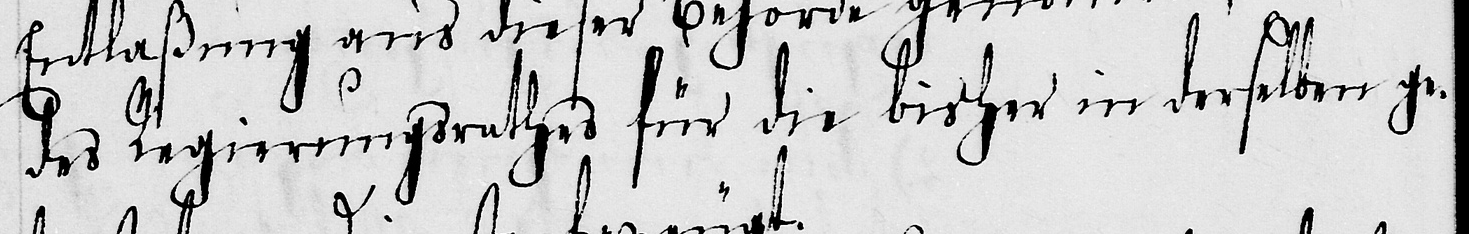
des Regierungsrathes für die bisher in derselben ge¬
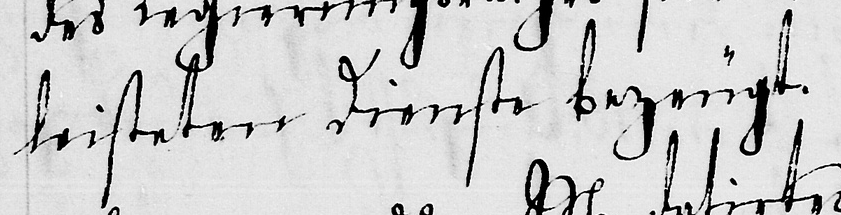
leisteten Dienste bezeugt.
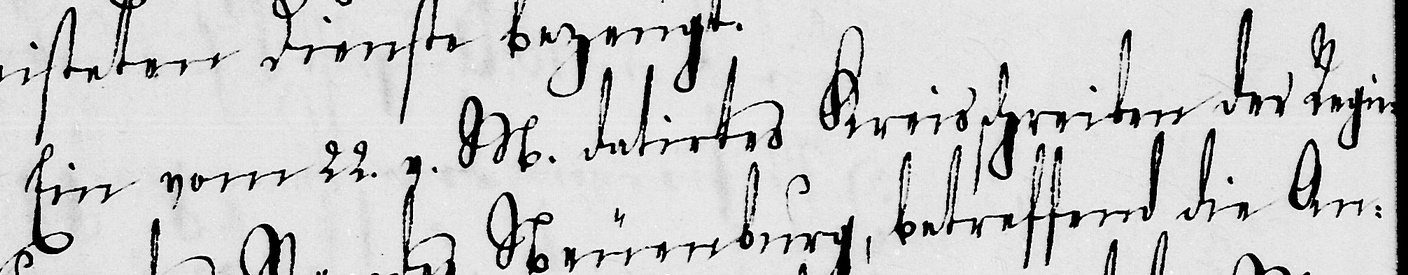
Ein vom 22. v. M. datirtes Kreisschreiben der Regie¬
